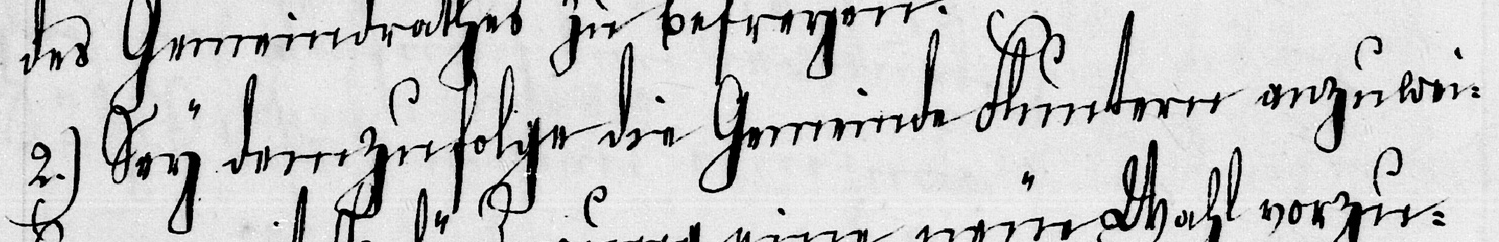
2.) Sey demzufolge die Gemeinde Fluntern anzuwei¬
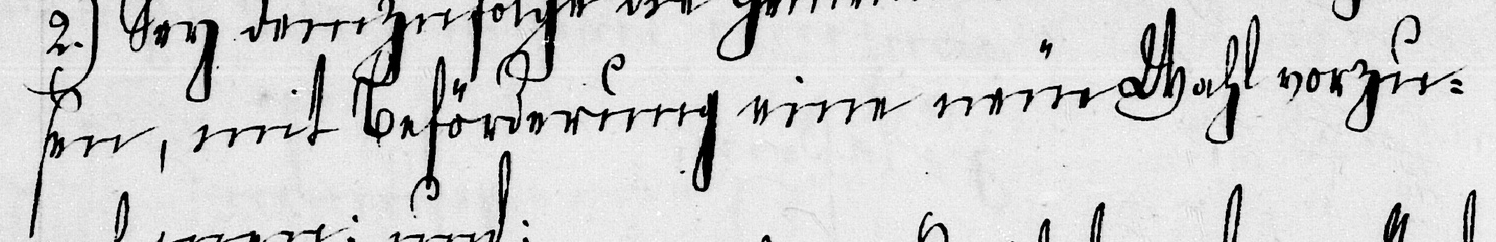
sen, mit Beförderung eine neue Wahl vorzu¬
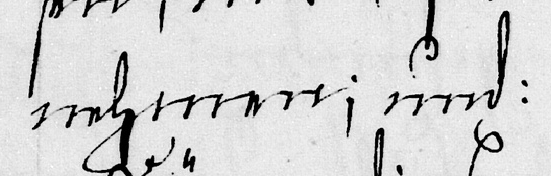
nehmen; und:
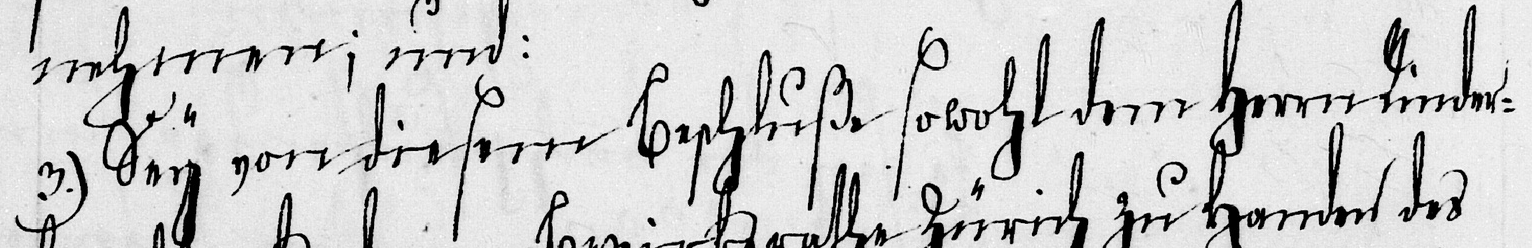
3.) Sey von diesem Beschluße sowohl dem Herrn Rinder¬
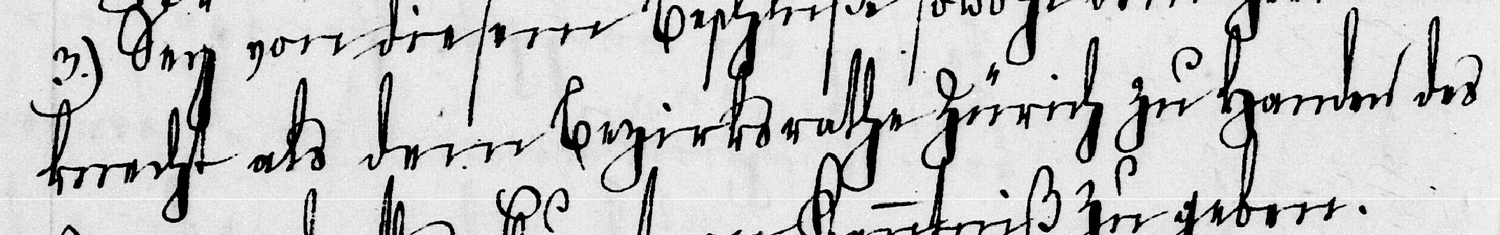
knecht als dem Bezirksrathe Zürich zu Handen des
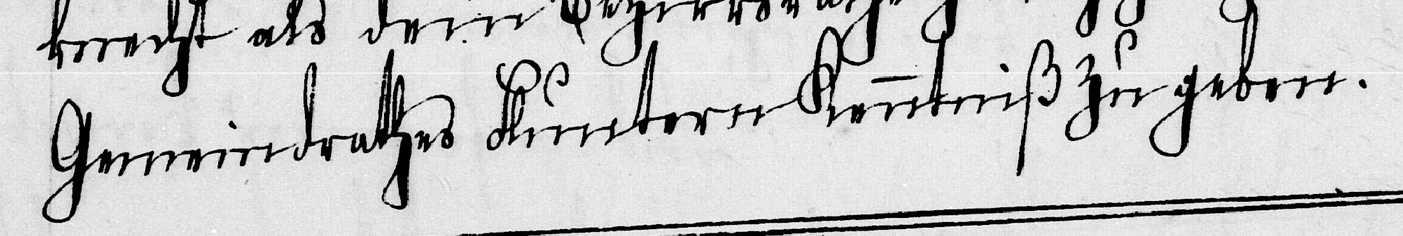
Gemeindrathes Fluntern Kenntniß zu geben.
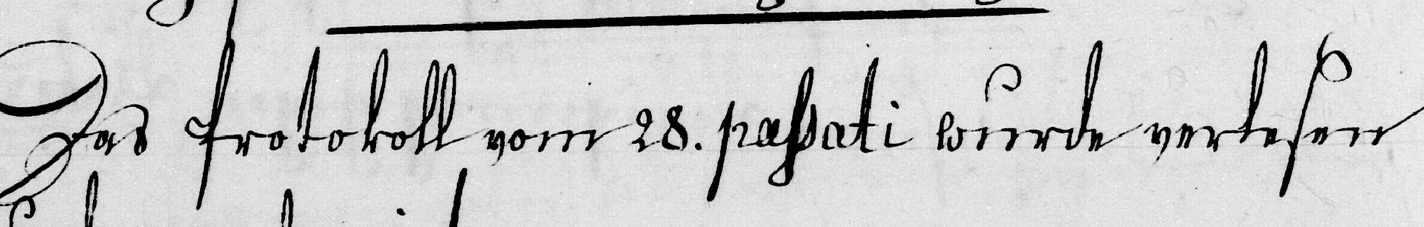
Das Protokoll vom 28. passati wurde verlesen
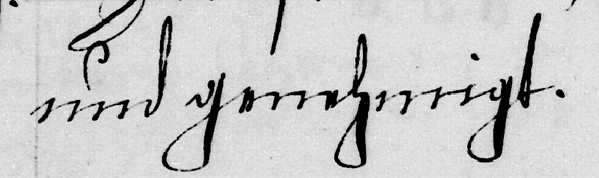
und genehmigt.
